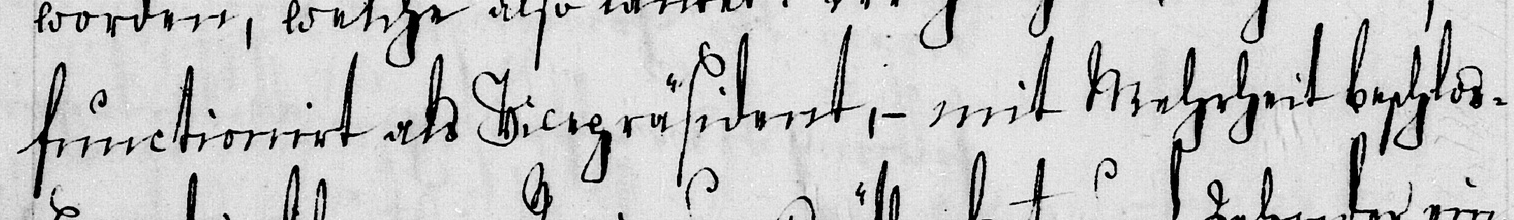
functionirt als Vicepräsident, – mit Mehrheit beschloß¬
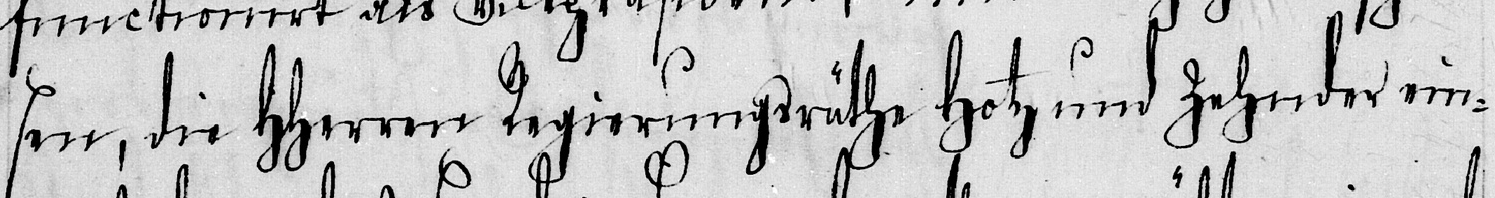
en, die HHerren Regierungsräthe Hotz und Zehnder ein¬
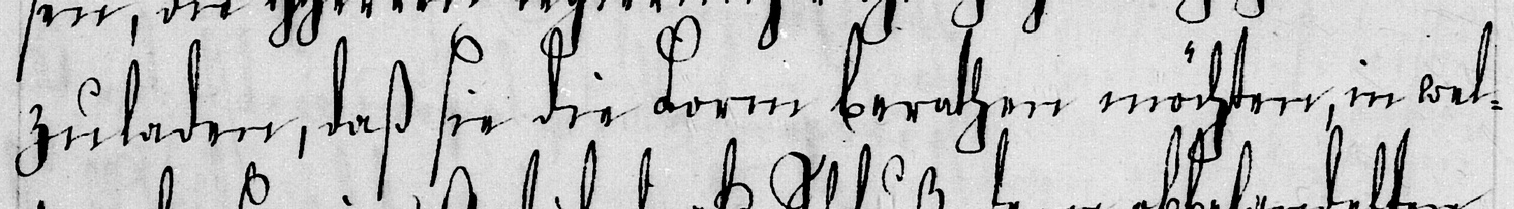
zuladen, daß sie die Form berathen möchten, in wel¬
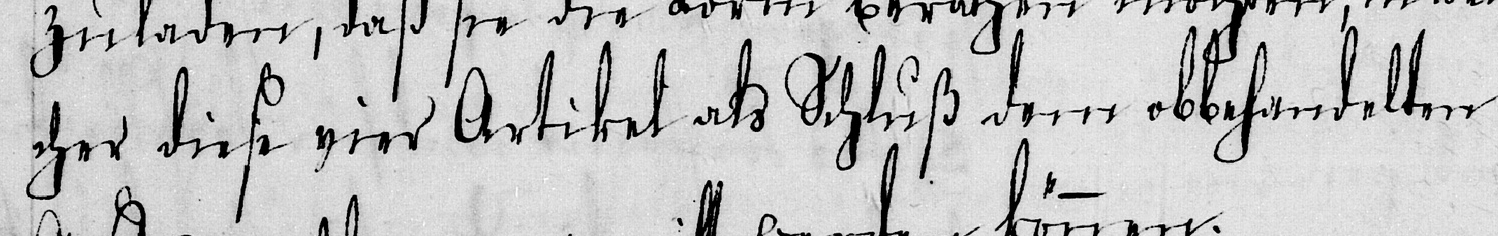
cher diese vier Artikel als Schluß dem abbehandelten
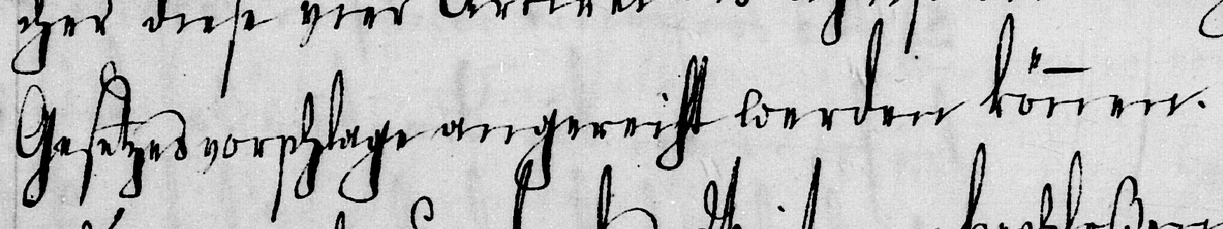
Gesetzesvorschlage angereiht werden können.
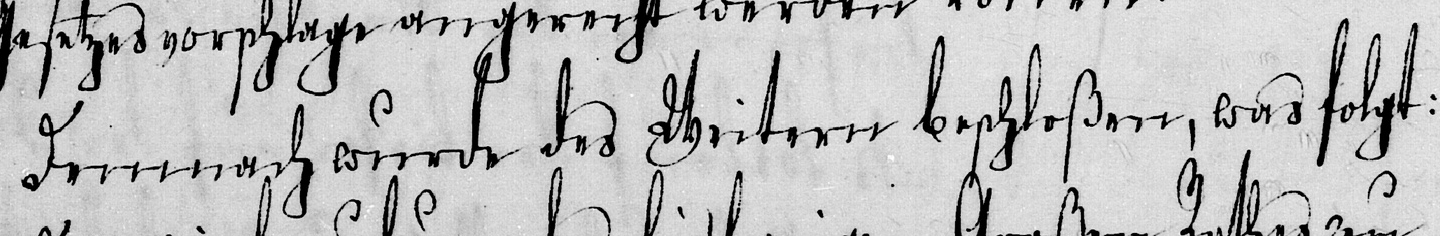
Demnach wurde des weitern beschloßen, was folgt:
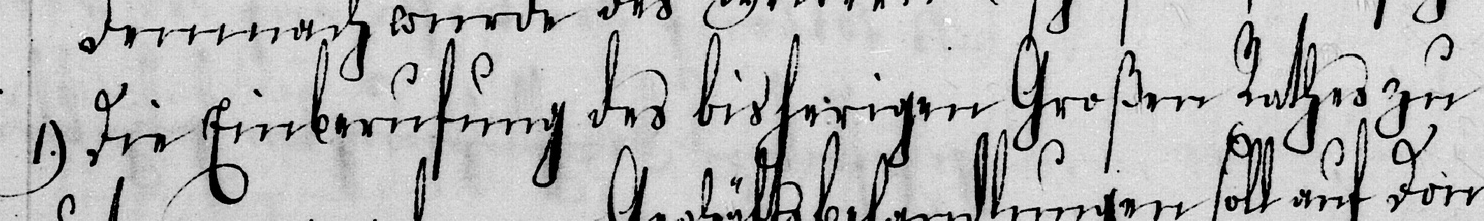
1.) Die Einberufung des bisherigen Großen Rathes zu
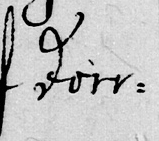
Don-
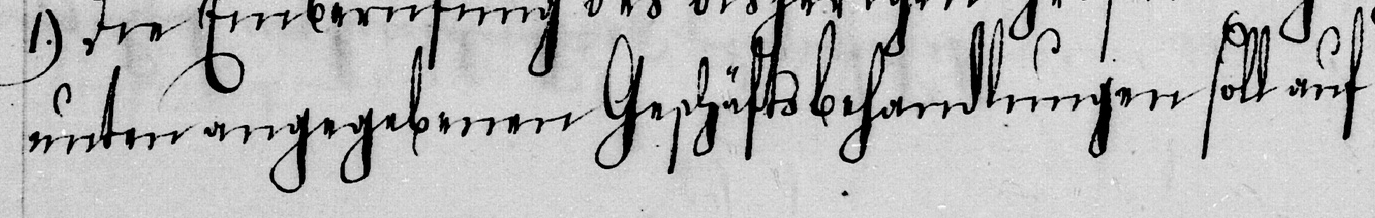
unten angegebenen Geschäftsbehandlungen soll auf
